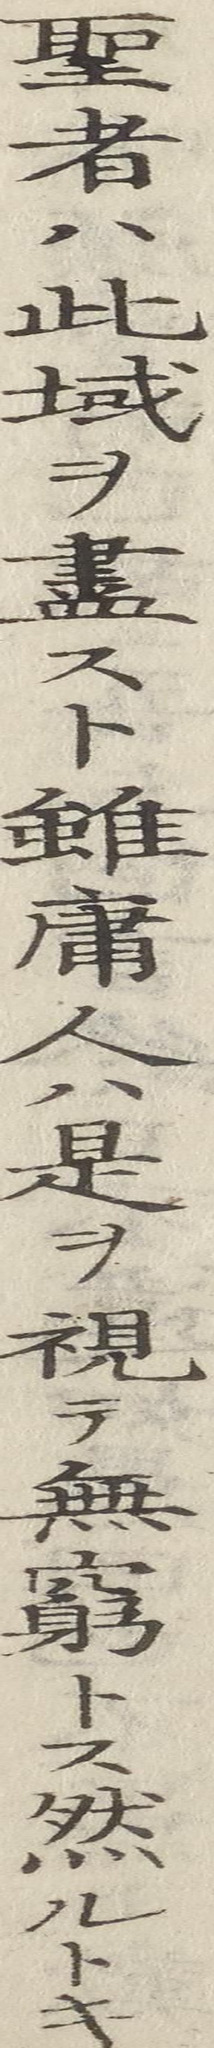聖者ハ此域ヲ尽スト雖庸人ハ是ヲ視テ無窮トス然ルトキ
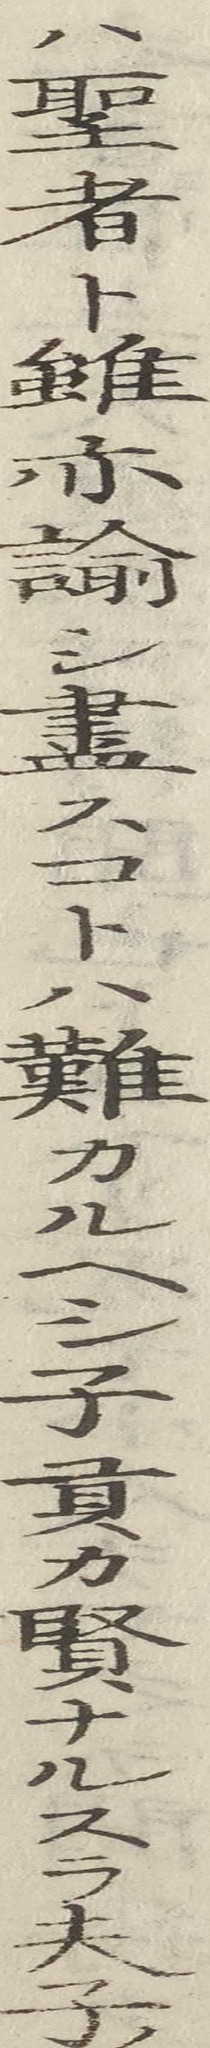ハ聖者ト雖亦論シ尽スコトハ難カルヘシ子貢カ賢ナルスラ夫子

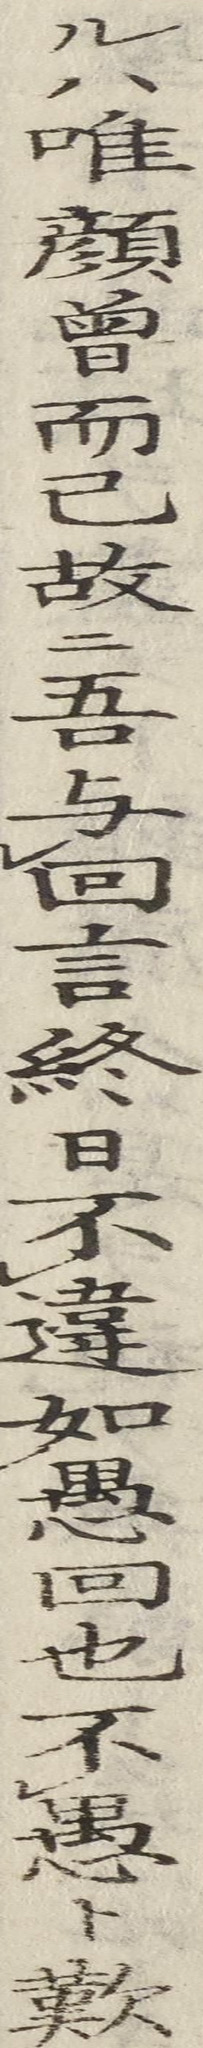ルハ唯顔曽而己故ニ吾与回言終日不違如愚回也不愚ト歎
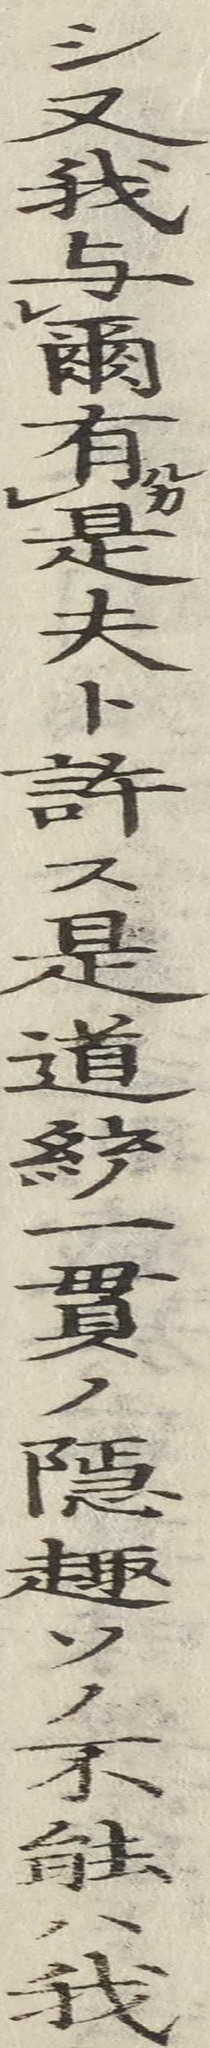シ又我与爾有是夫ト許ス是道統一貫ノ隠趣ソノ不能ハ我
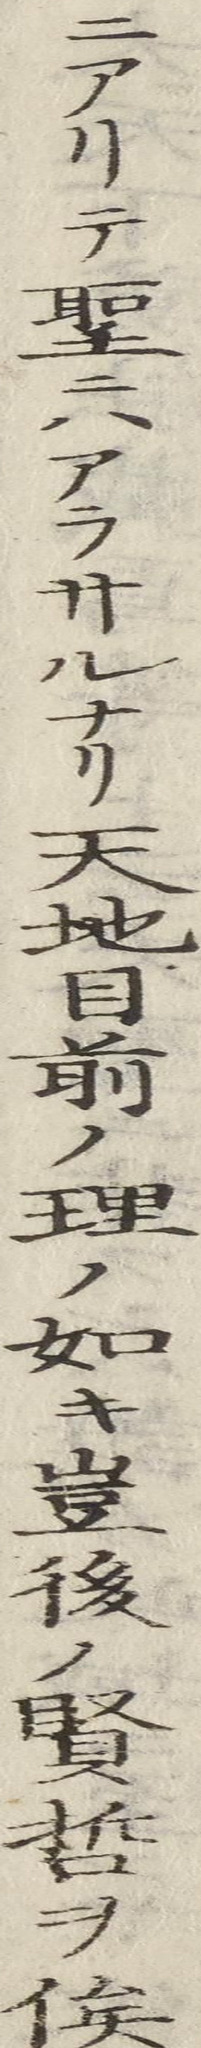ニアリテ聖ニハアラサルナリ天地目前ノ理ノ如キ豈後ノ賢哲ヲ俟
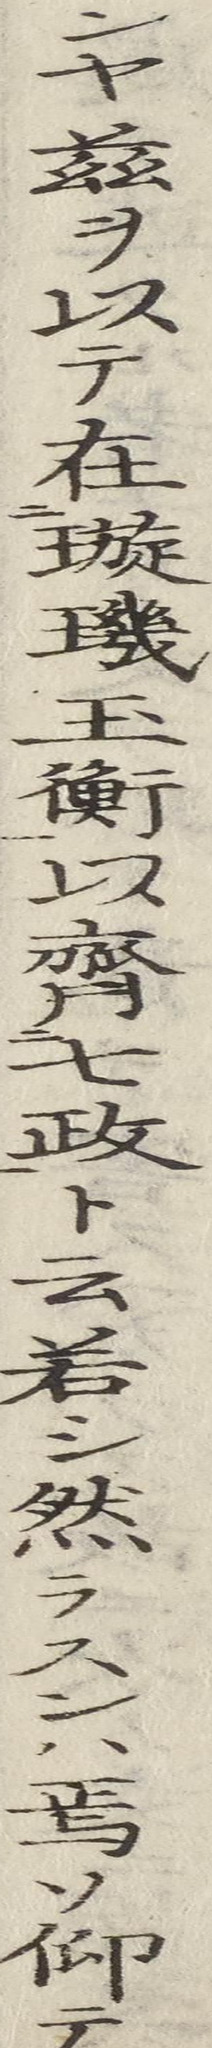ンヤ茲ヲ以テ在ニ璇璣玉衡以斉ニ七政ト云若シ然ラスンハ焉ソ仰テ
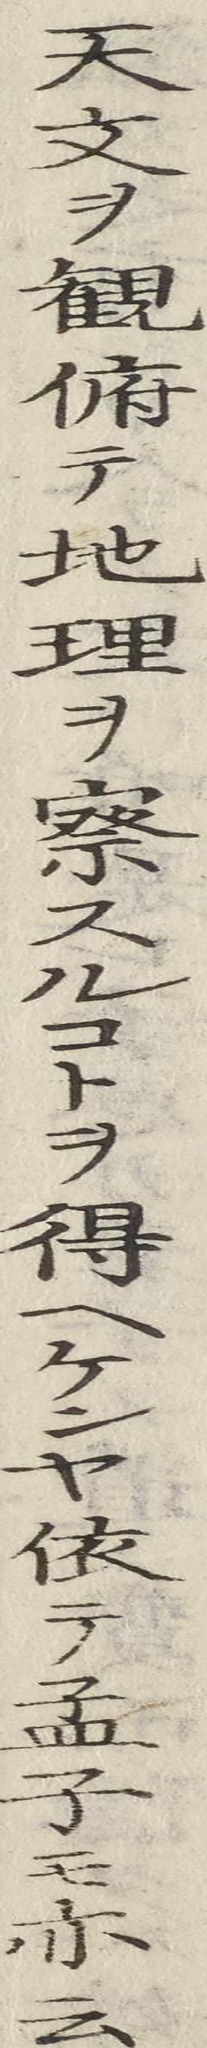天文ヲ観俯テ地理ヲ察スルコトヲ得ヘケンヤ依テ孟子モ亦云
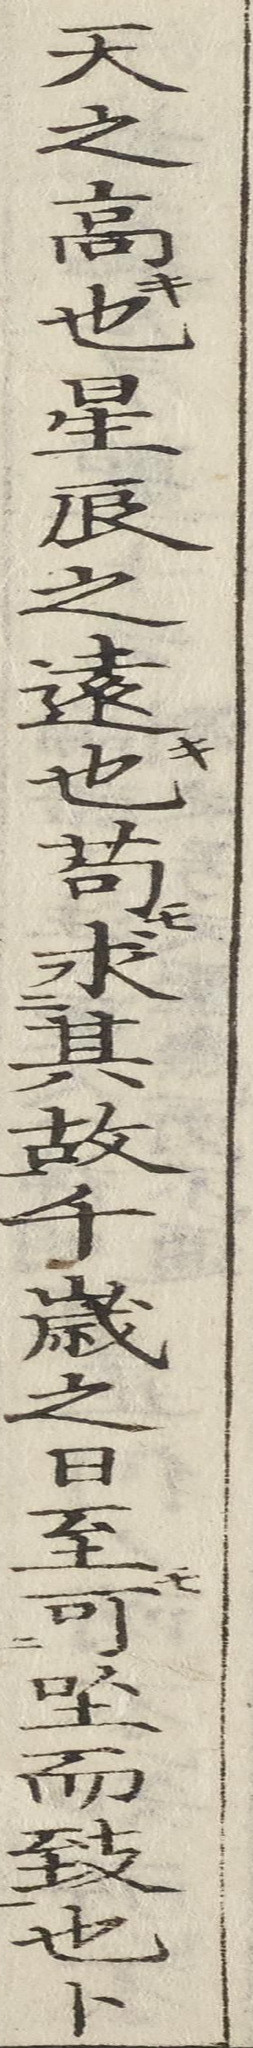天之高也星辰之遠也苟求ニ其故千歳之日至可ニ坐而致也ト
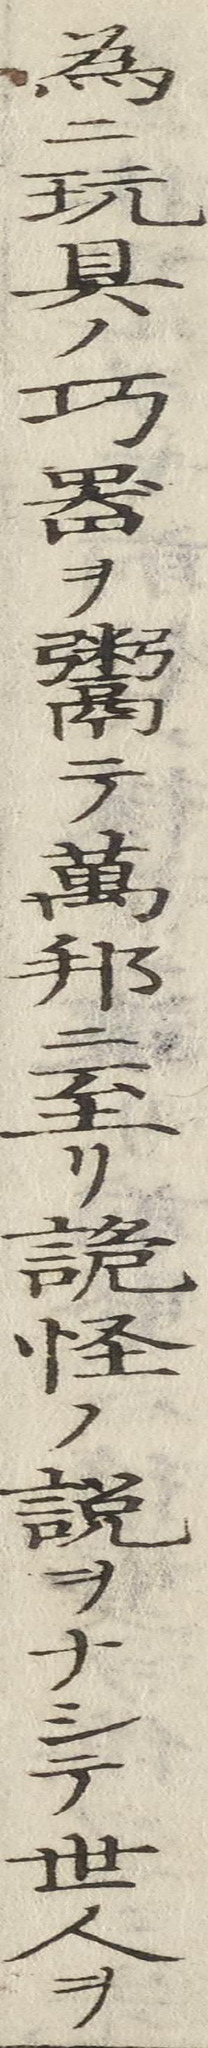為ニ玩具ノ巧器ヲ鬻テ万邦ニ至リ詭怪ノ説ヲナシテ世人ヲ
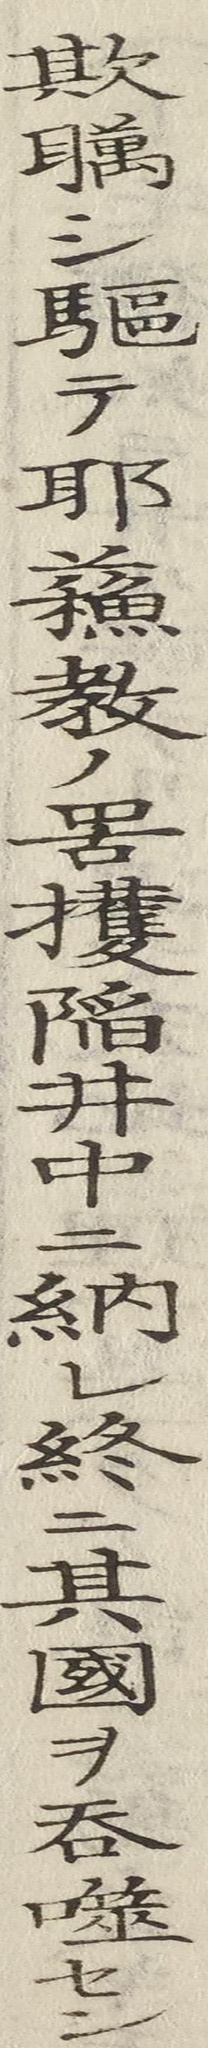欺瞞シ駆テ耶蘇教ノ罟擭陥井中ニ納レ終ニ其国ヲ呑噬セン
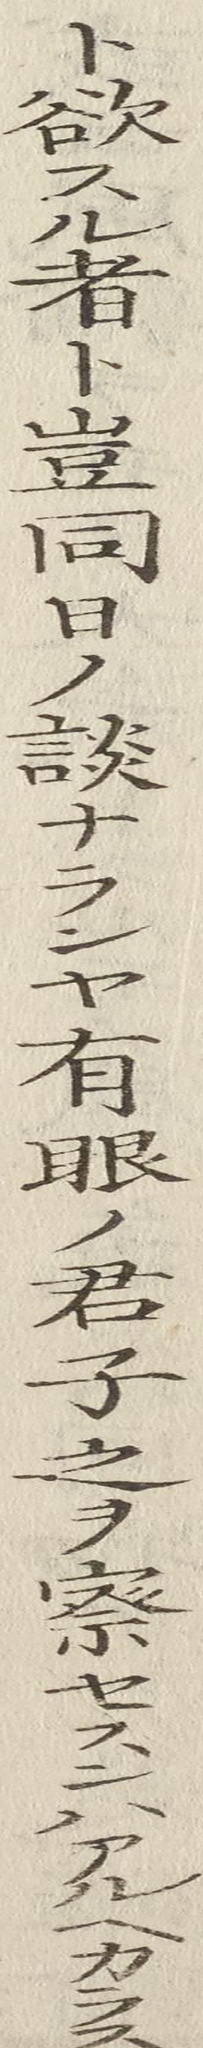ト欲スル者ト豈同日ノ談ナランヤ有眼ノ君子之ヲ察セスンハアルヘカラス
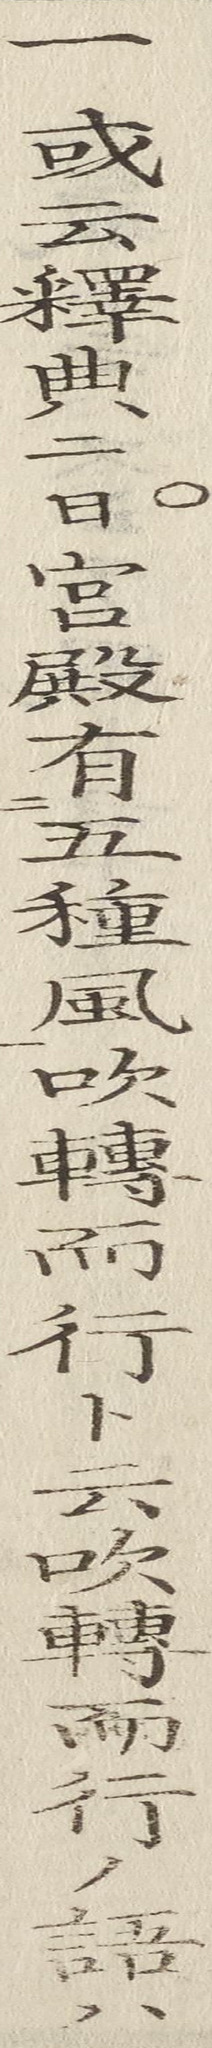一或云釈典ニ日〇宮殿有ニ五種風吹転而行ト云吹転而行ノ語ハ
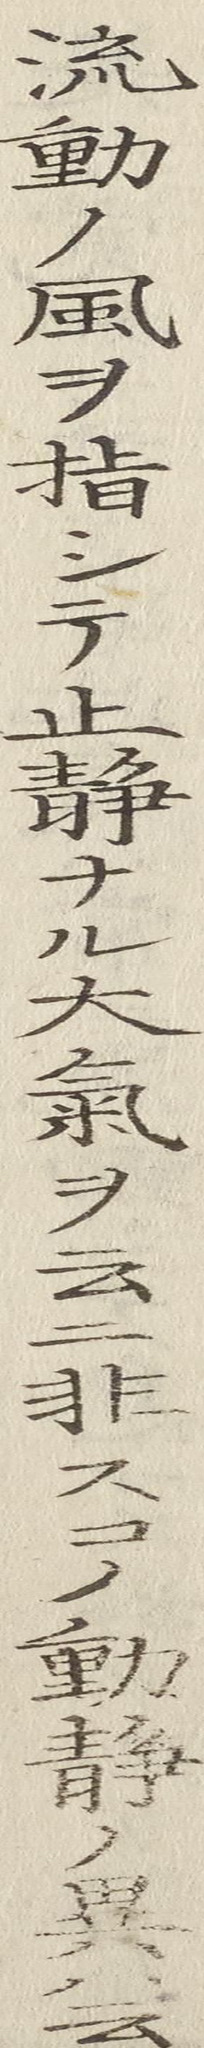流動ノ風ヲ指シテ止静ナル大気ヲ云ニ非スコノ動静ノ異ハ云
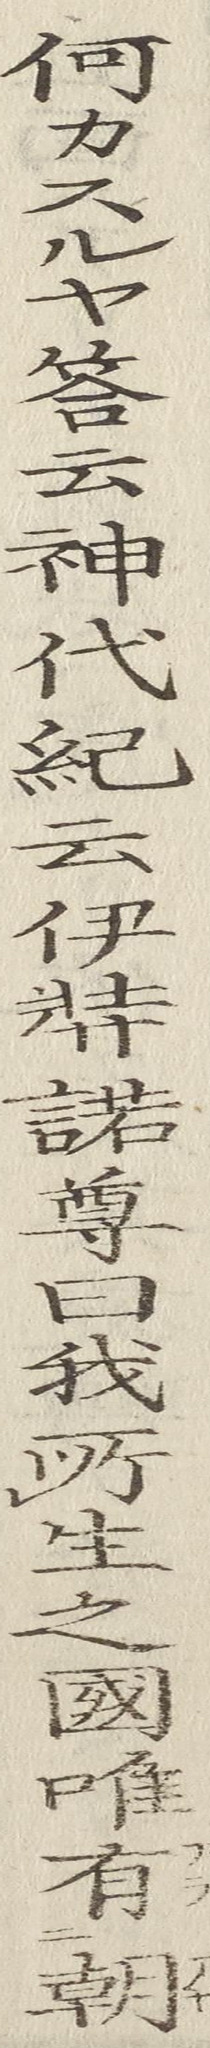何カスルヤ答云神代紀紀云伊弉諾尊曰我所生之国唯有ニ朝
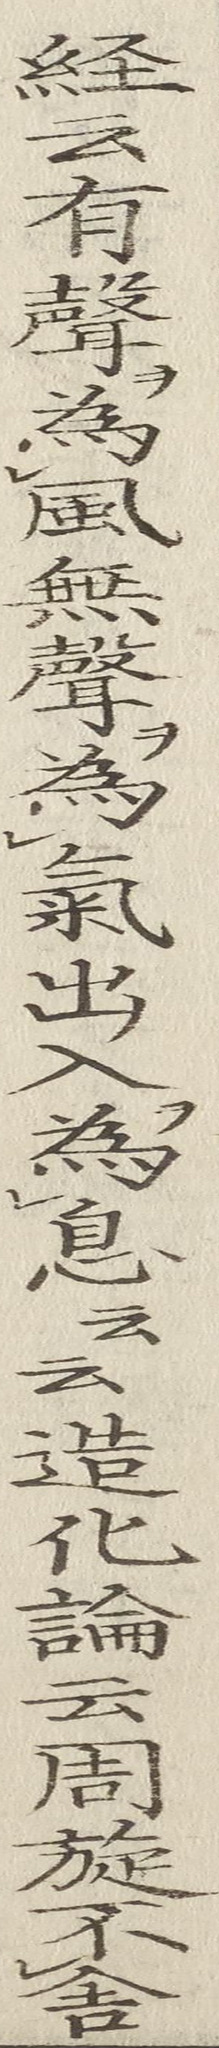経云有声為風無声為気出入為息云云造化論云周旋不舎
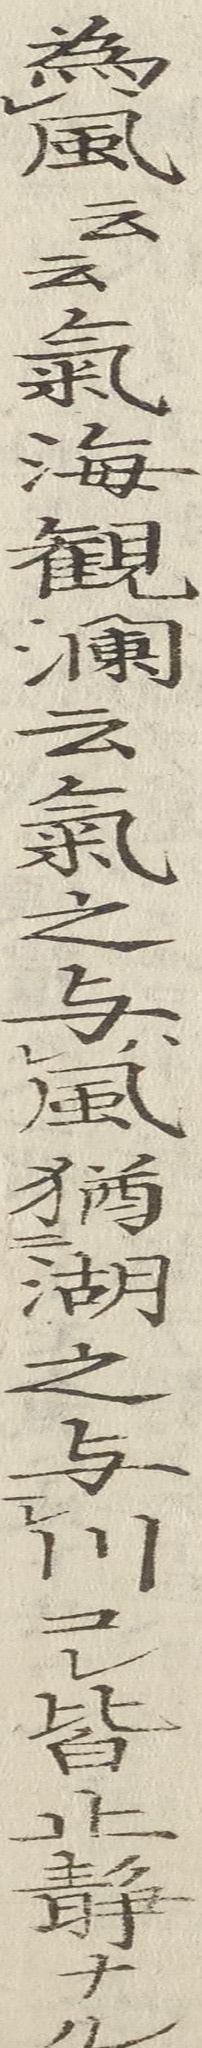為風云云気海観瀾云気之与風猶ニ湖之与レ川コレ皆止静ナル
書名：護法新論　二編　下
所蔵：東京大学地震研究所図書室 Earthquake Research Institute Library, The University of Tokyo, JAPAN
